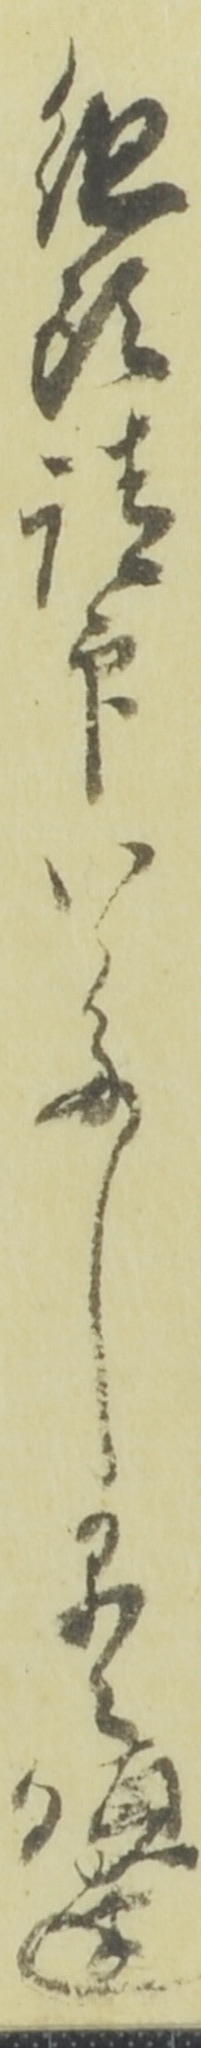組頭請印いたし早々順達
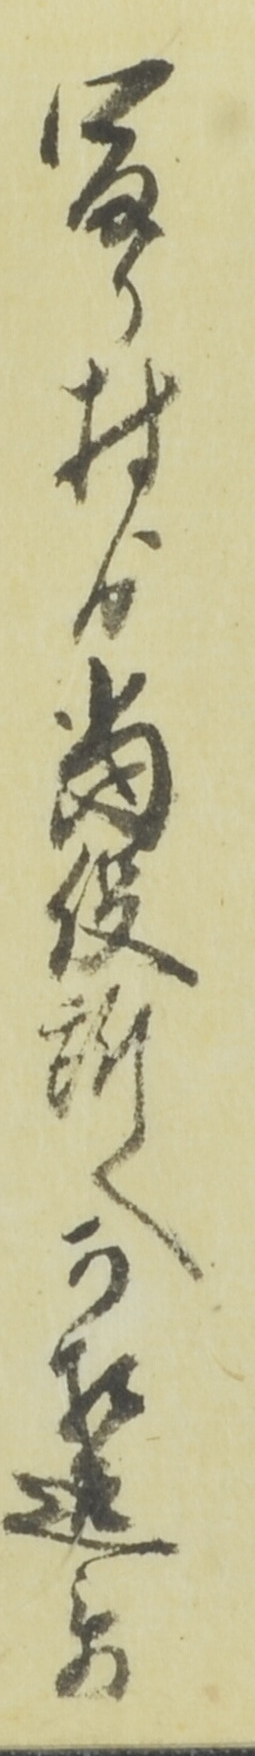留り村ゟ当役所へ可相返もの
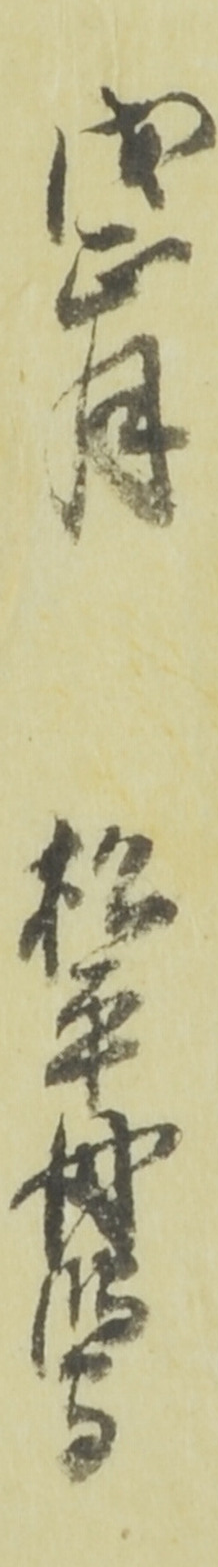戌正月松平丹波守
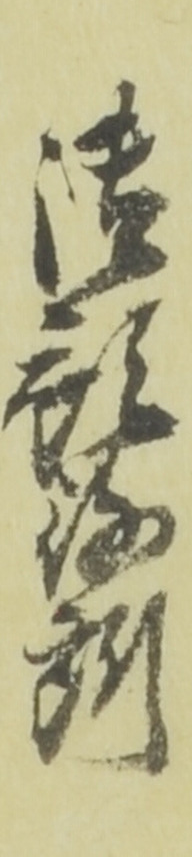御預役所
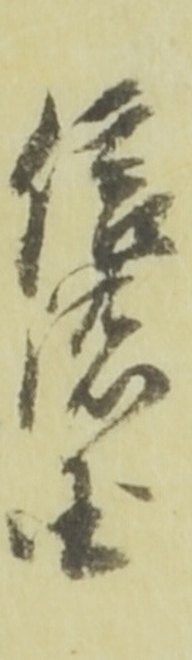信濃国
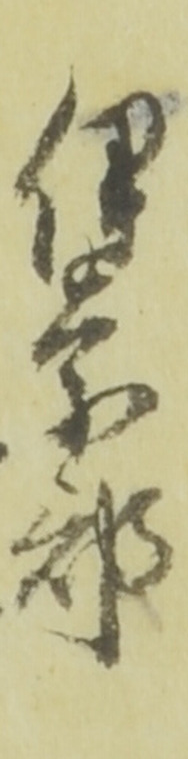伊奈郡
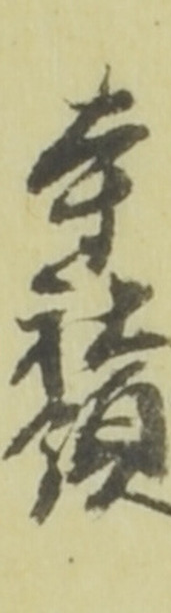寺社領
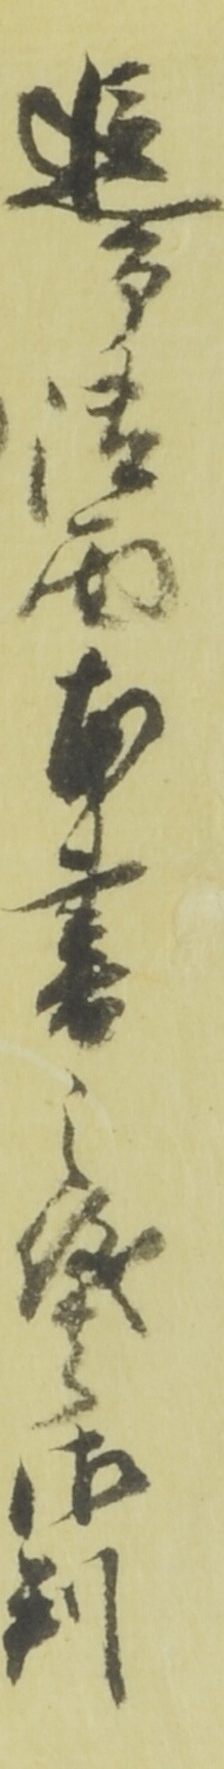追而御面本書之儀は御判
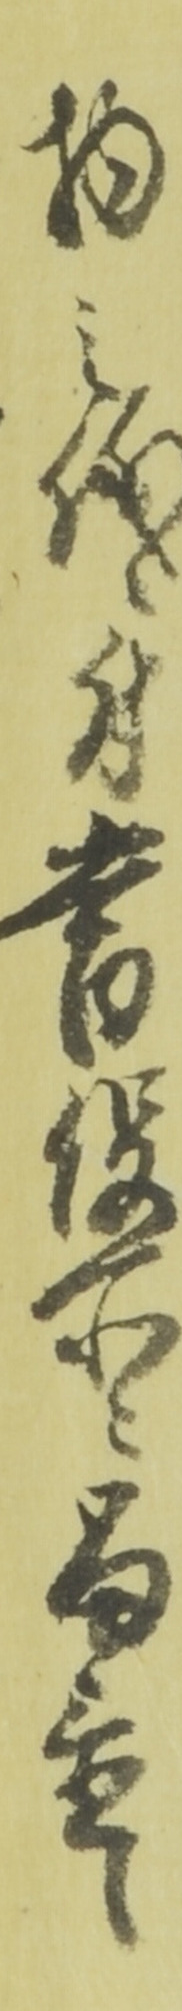物之儀ニ付当役所ニ留置候
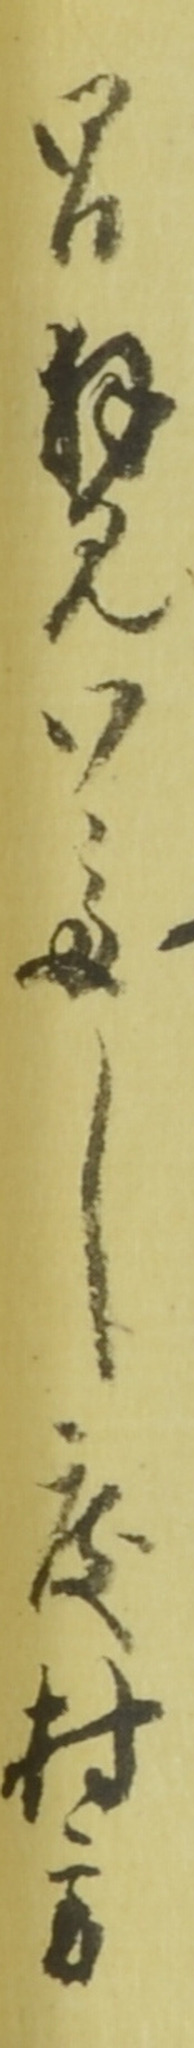間拝見いたし度村方
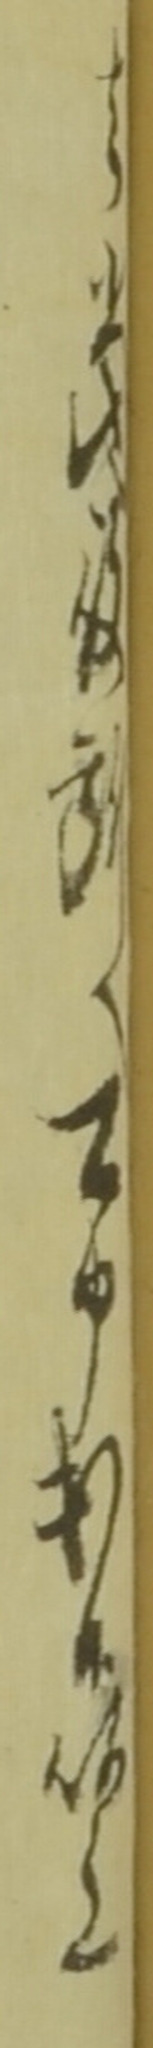は当役所へ可申出候以上
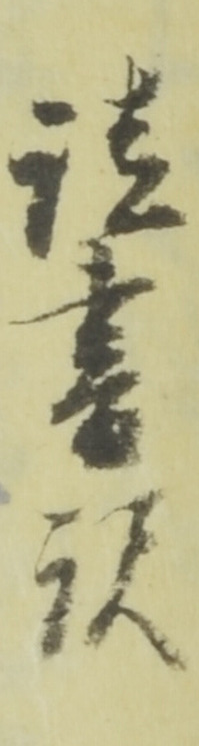諸書訳
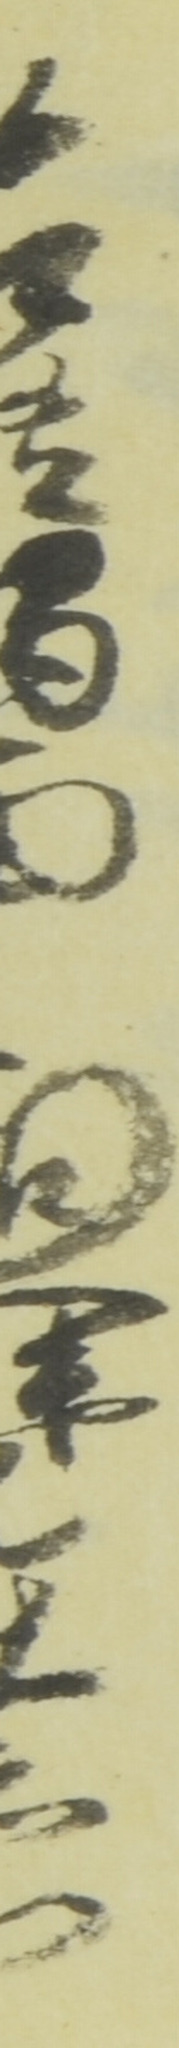右御触面之趣拝見仕承知

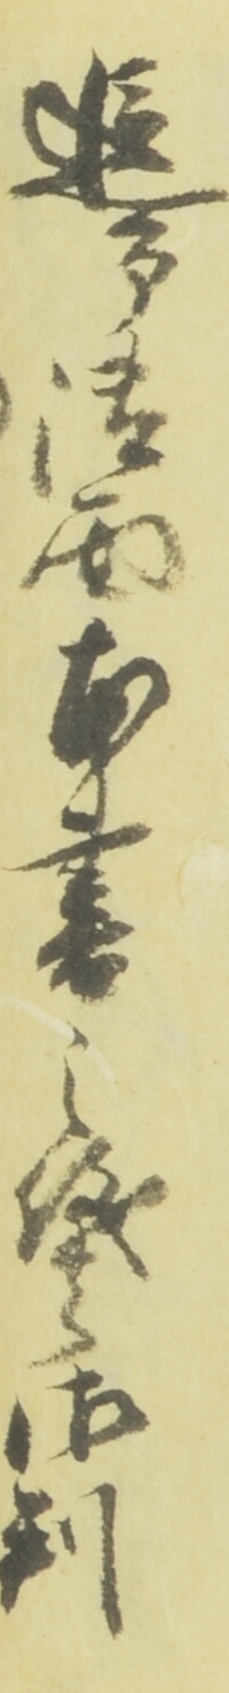追而御面本書之儀は御判
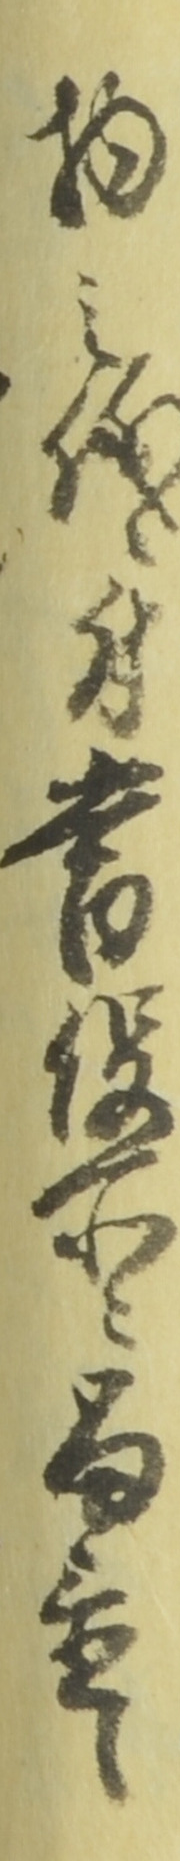物之儀ニ付当役所ニ留置候
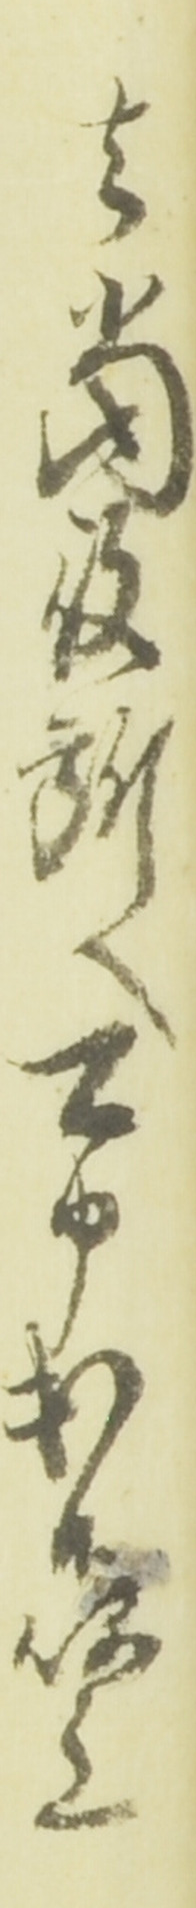は当役所へ可申出候以上
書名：御触書御書附控
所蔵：伊那市立高遠町図書館・合同会社AMANE
